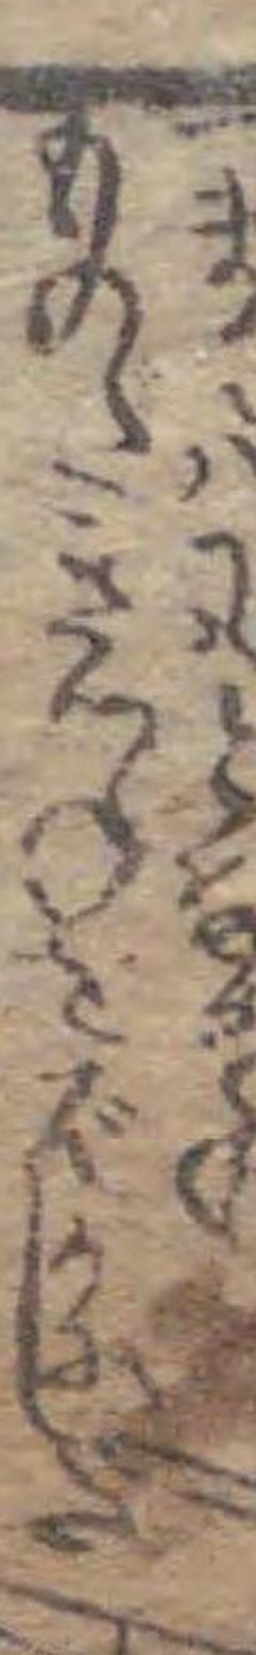ものたきつねをばかにした
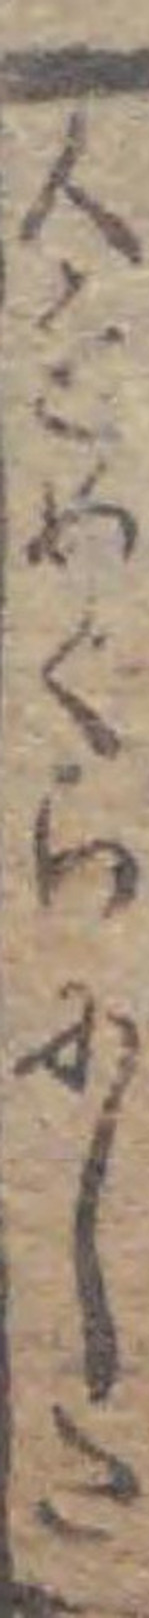人をめくらにした

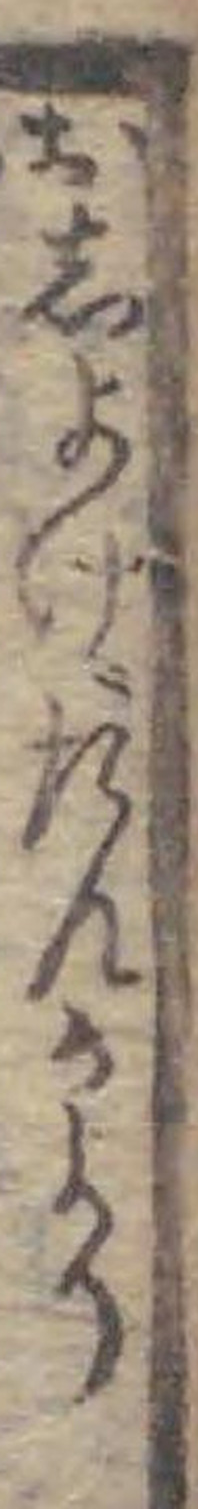おしよけにたんかより
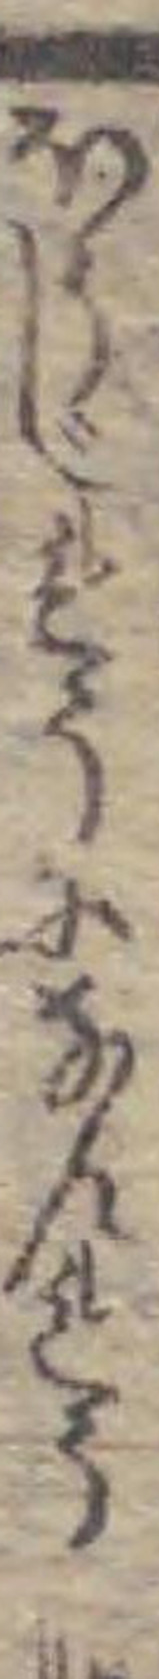ほうじれうになんれう
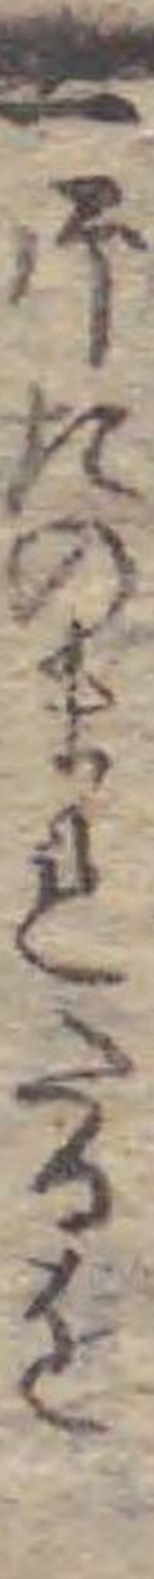一ふたのまれたるを
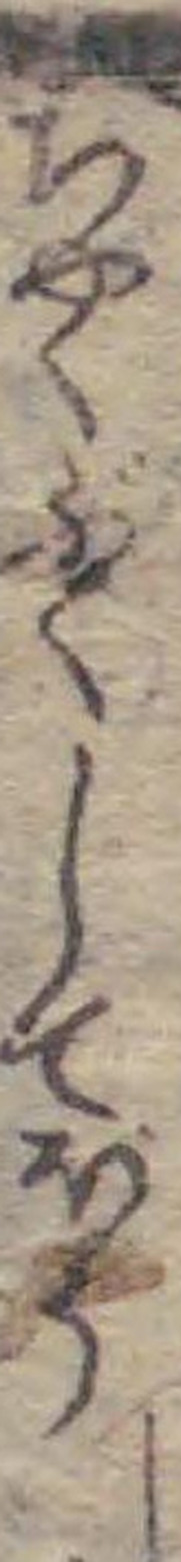ちやくぶくしてほう
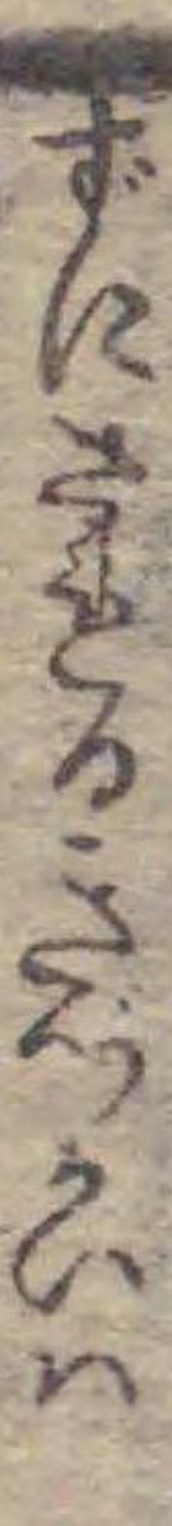ずにされるきつかいは
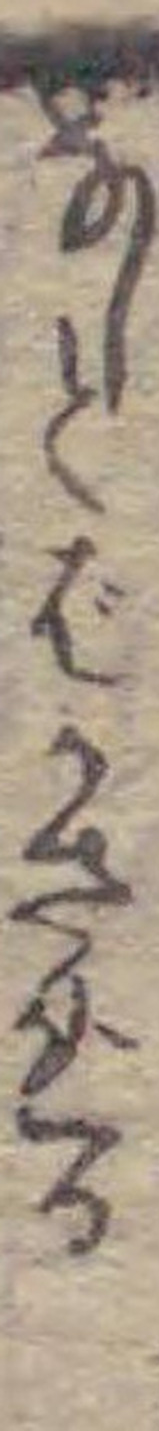なしとばかされる
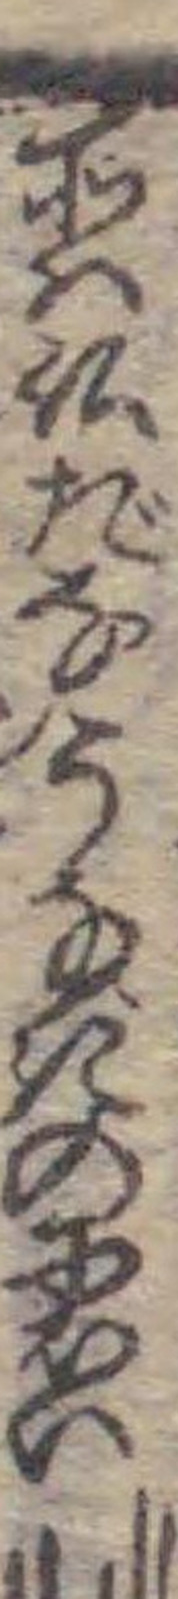所は仏だなうなきのにほい
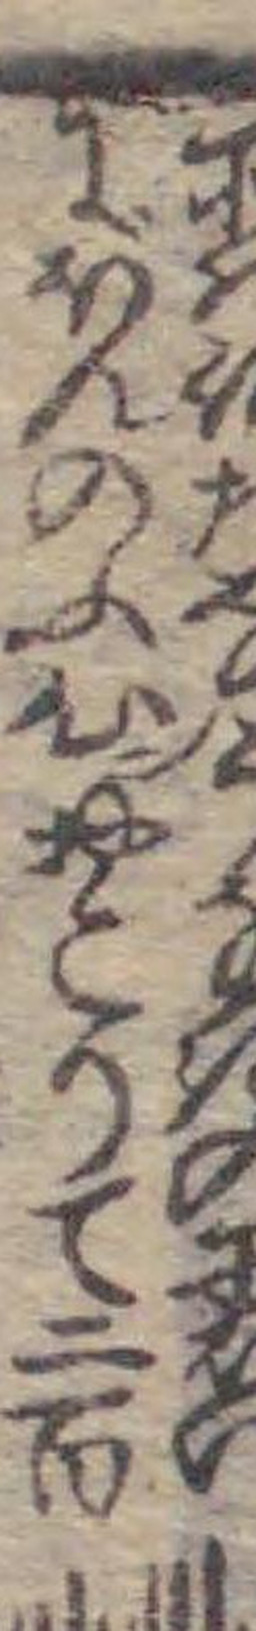にほんのふ心二百
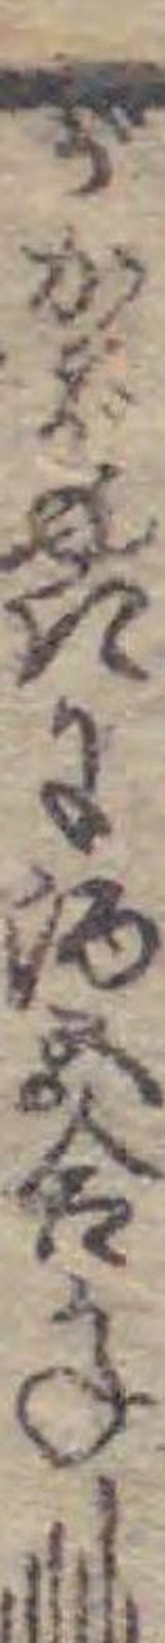がかばやきに酒五合かね
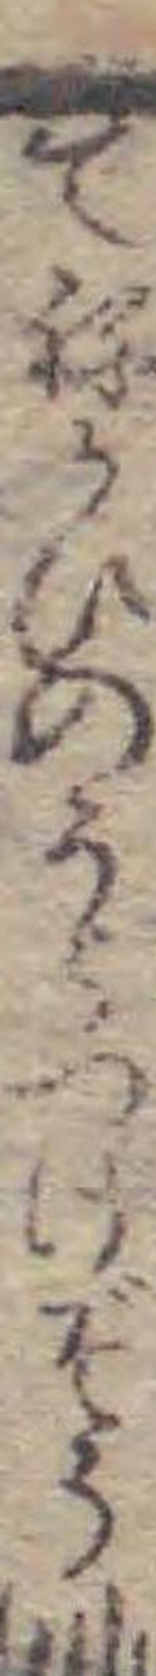てねかひのうらつけぞう
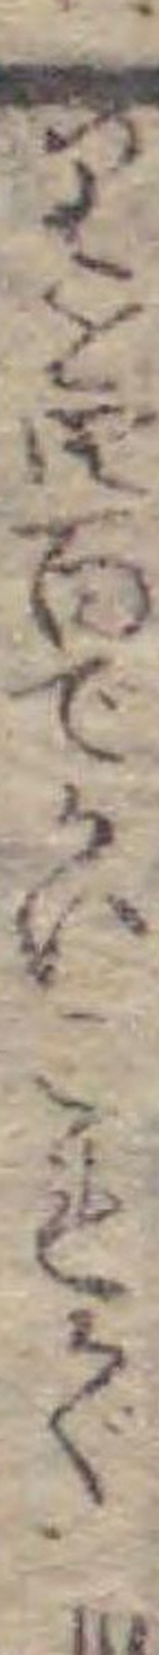りを四百でかいこれで
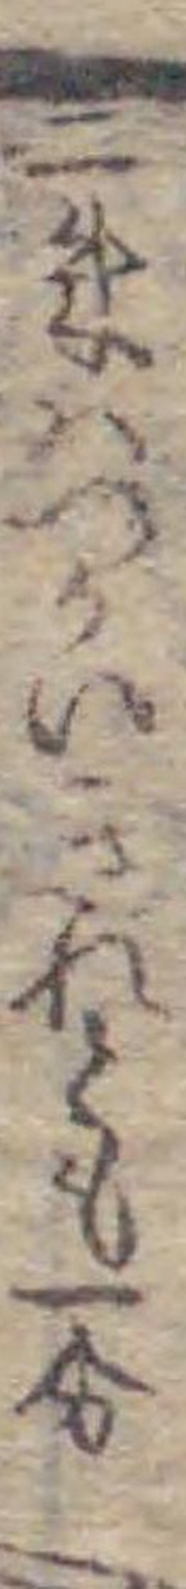二朱はつかいきれとも一分
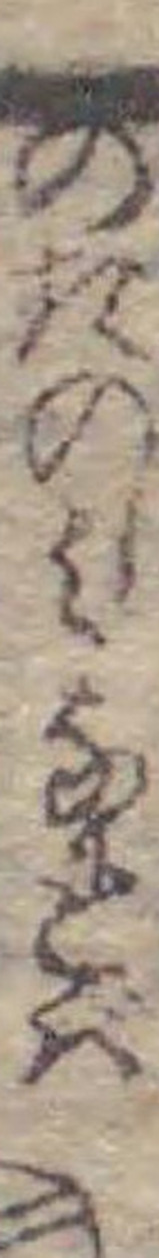のたのしみなれば
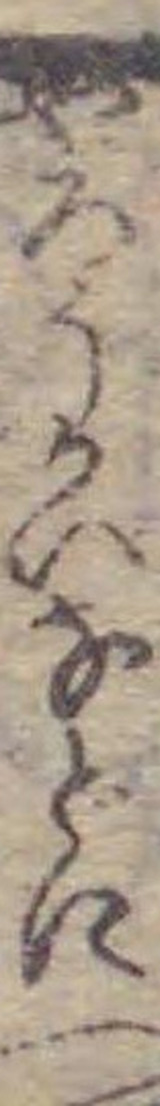やろうかいなとに
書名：紺屋百物語 : 3巻
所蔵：国立国会図書館 National Diet Library, JAPAN
